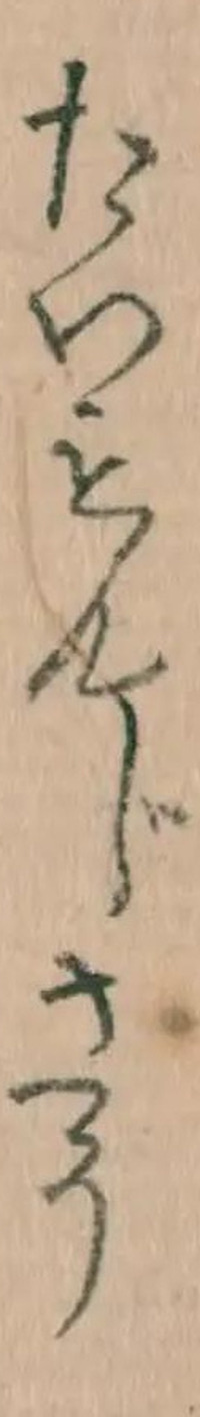たいもんしさう
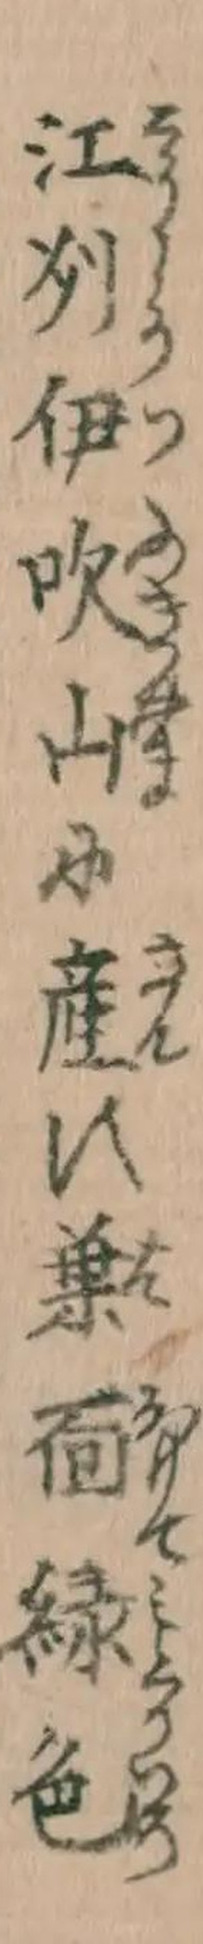江州伊吹山に産す葉面緑色
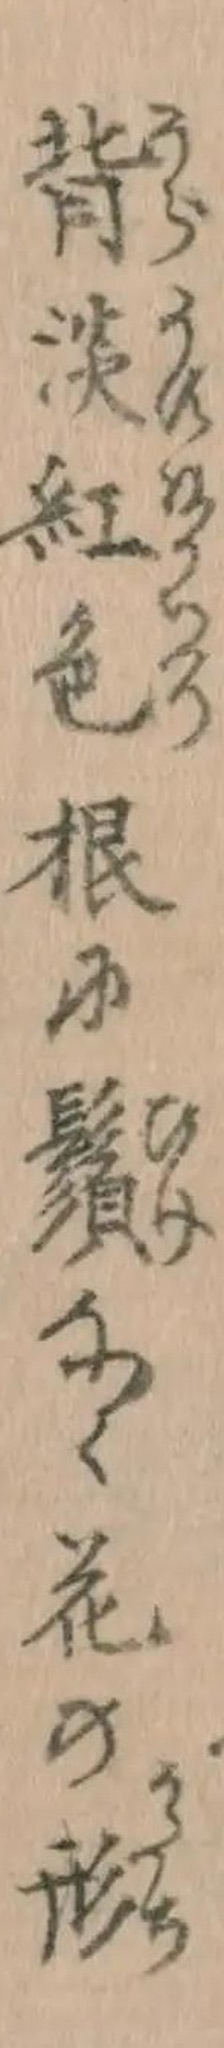背淡紅色根に鬚なく花の形
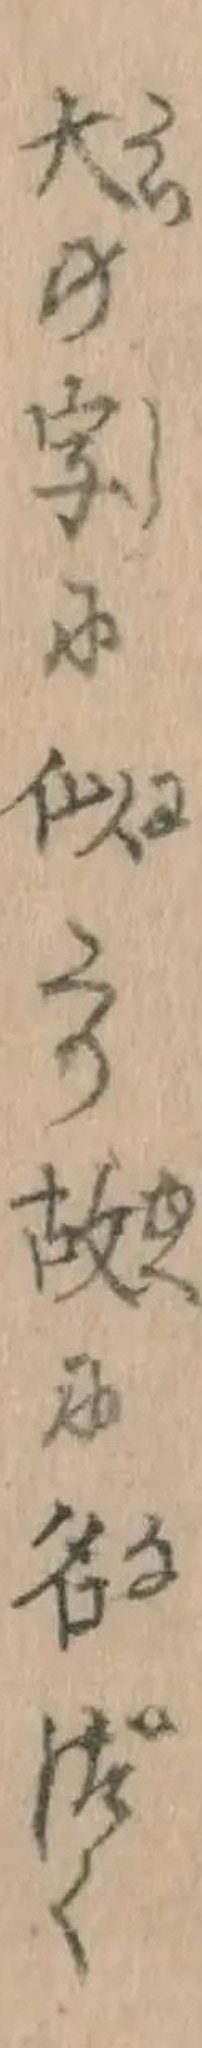大の字に似たり故に名づく

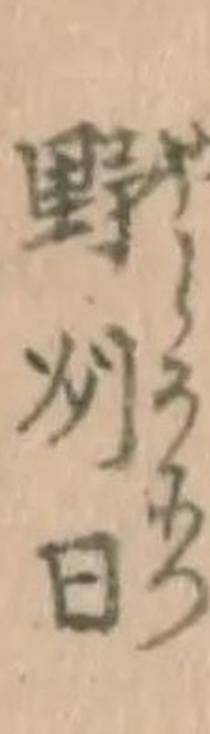野州日
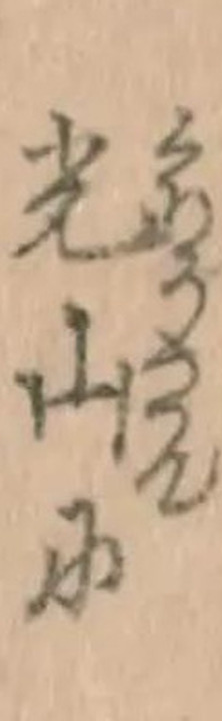光山に
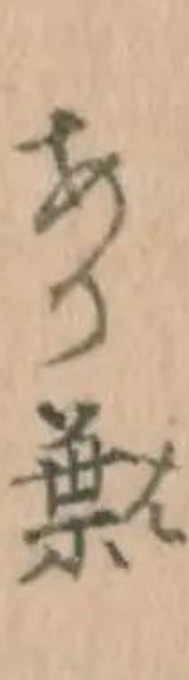あり葉
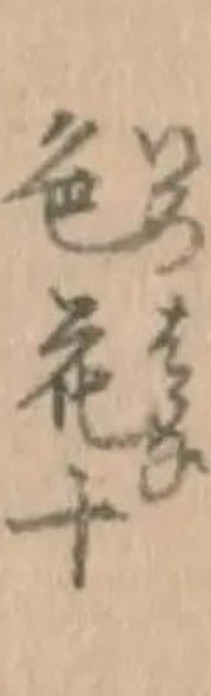色花十
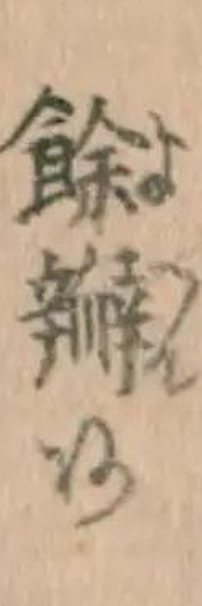余弁あ
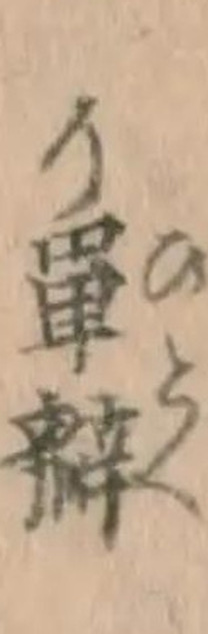り単弁
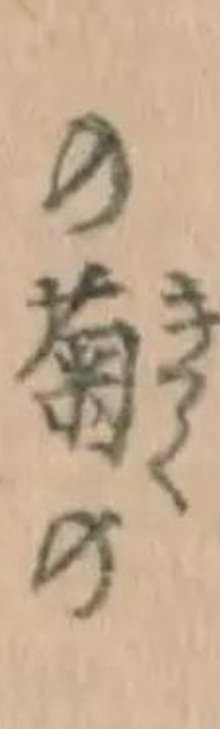の菊の
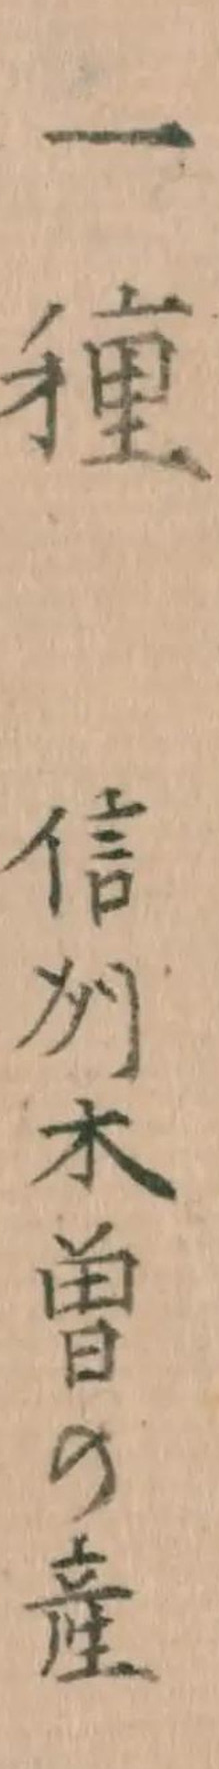一種信州木曽の産
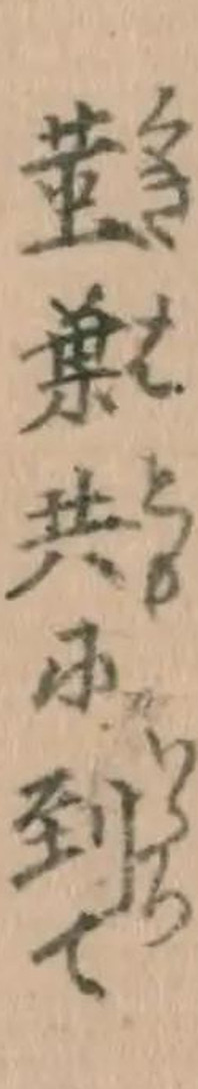茎葉共に到て
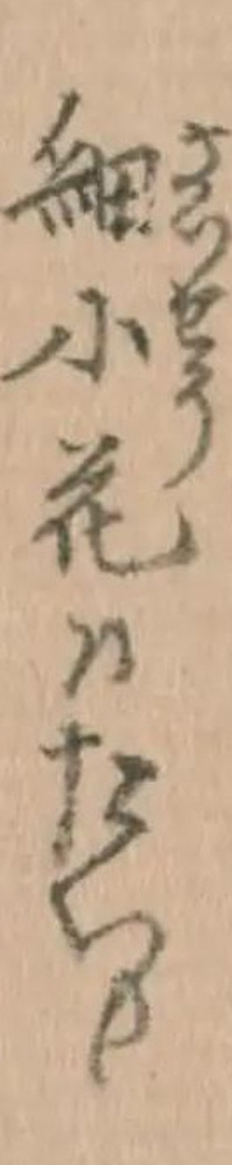細小花はたいも
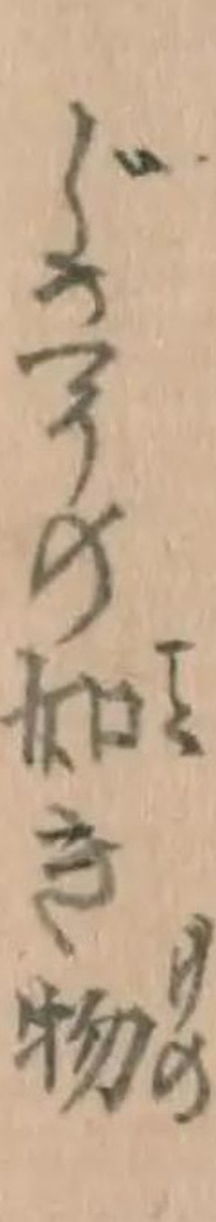じさうの如き物
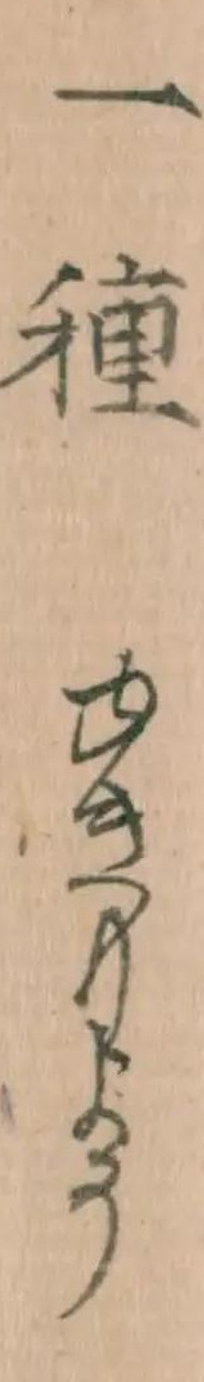一種ゆきもよう
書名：本草図譜. 巻34-36
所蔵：国立国会図書館 National Diet Library, JAPAN
